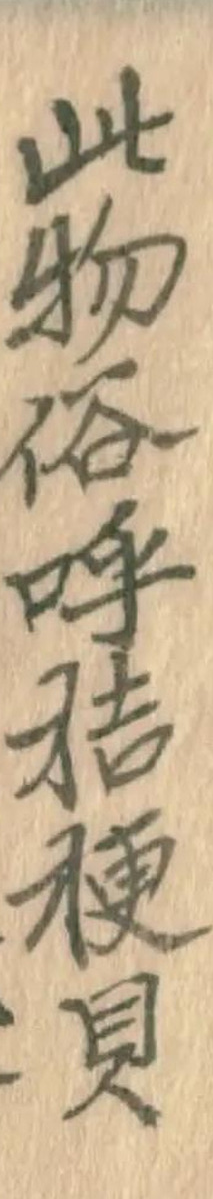此物俗呼桔梗貝
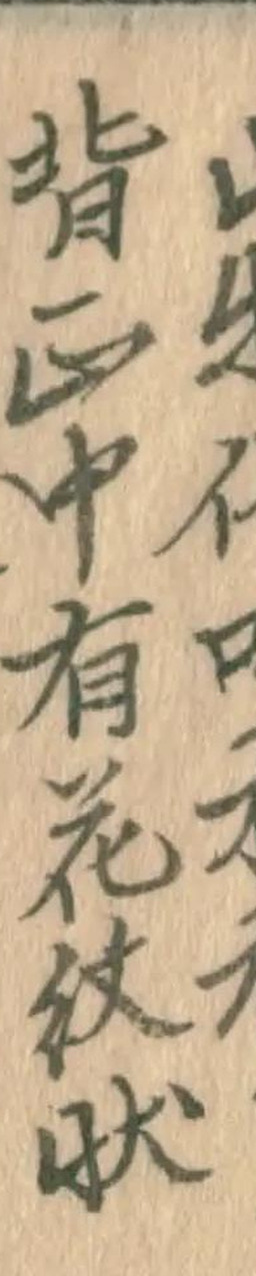背正中有花紋状
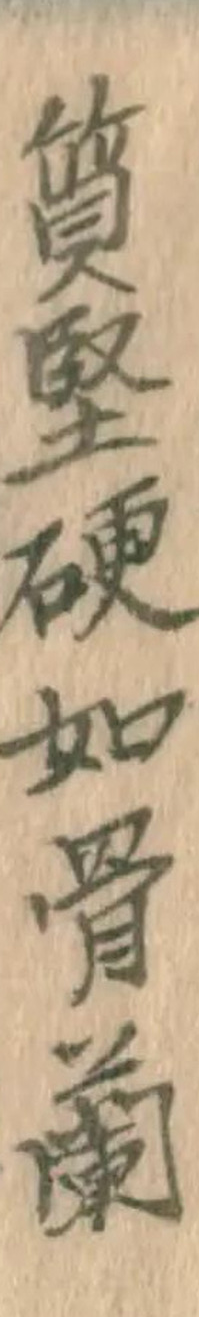質堅硬如骨蘭
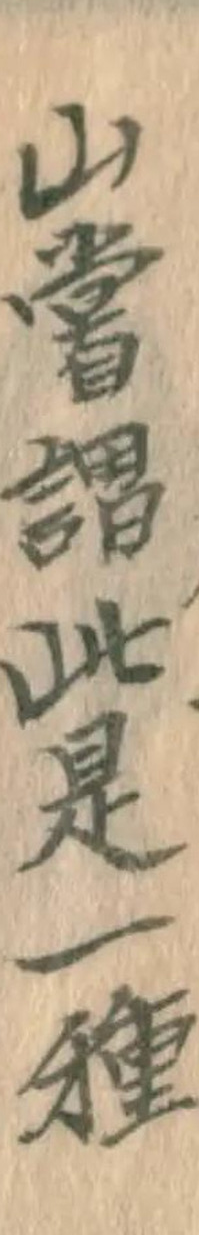山嘗謂此是一種
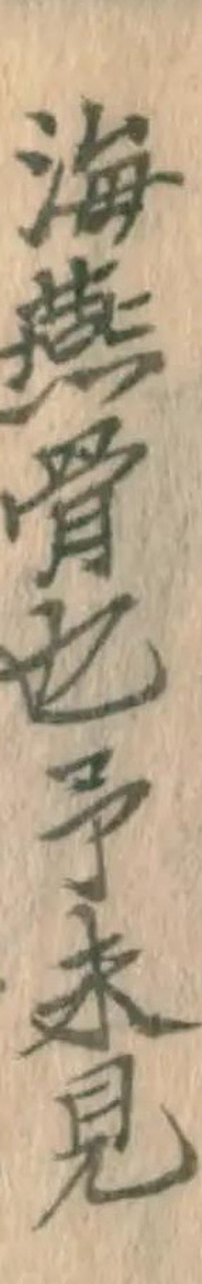海燕骨也予未見
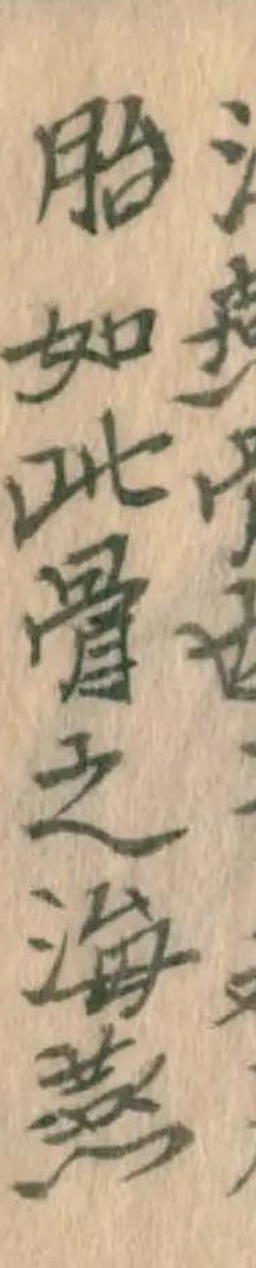胎如此骨之海燕
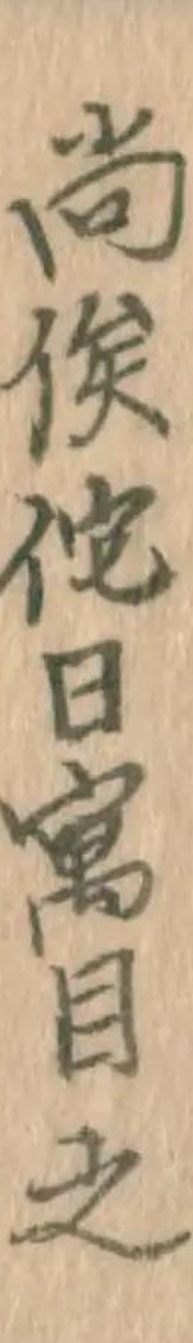尚俟侘日寓目之
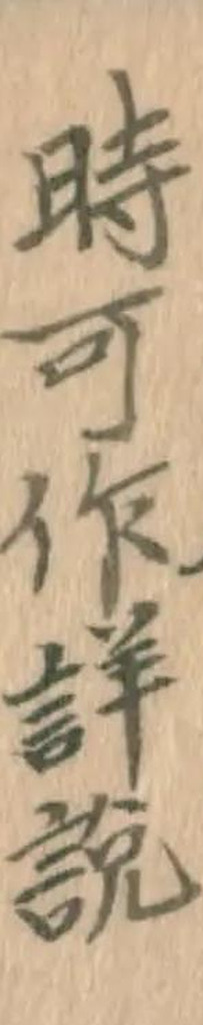時可作詳説
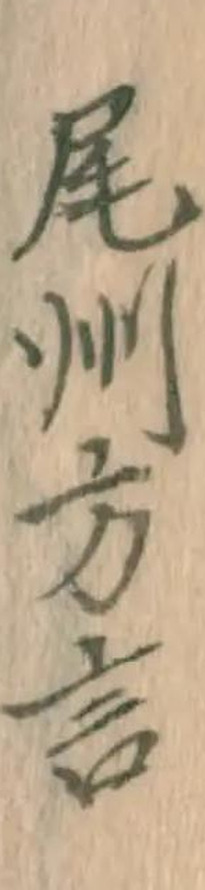尾州方言
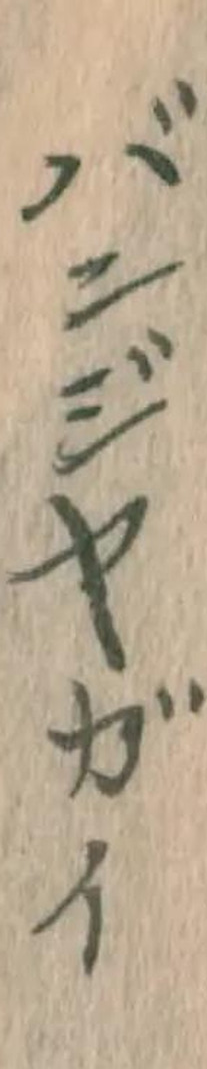バンジヤガイ

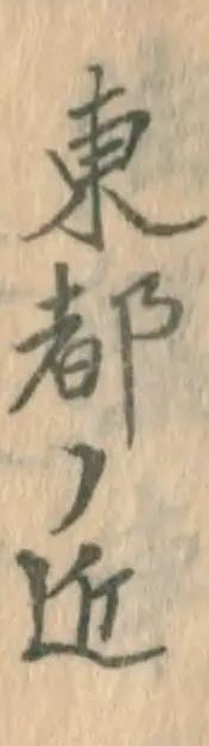東都ノ近
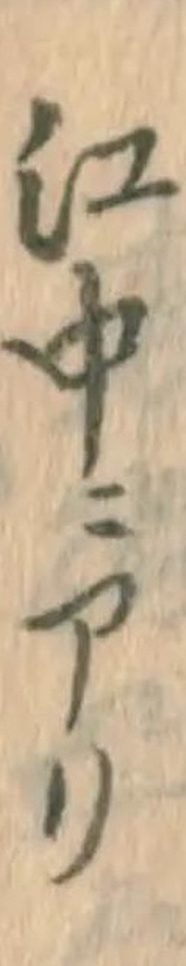江中ニアリ
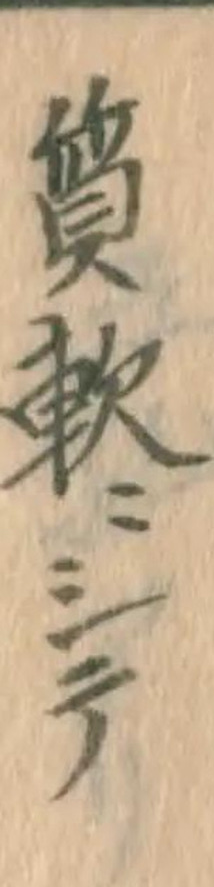質軟ニシテ
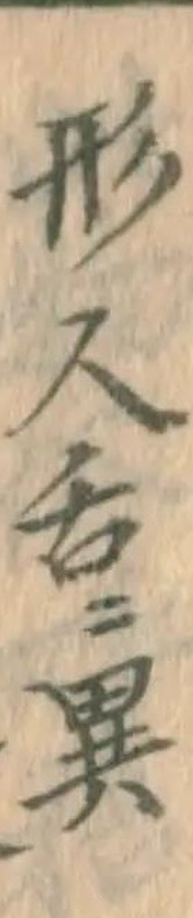形人舌ニ異
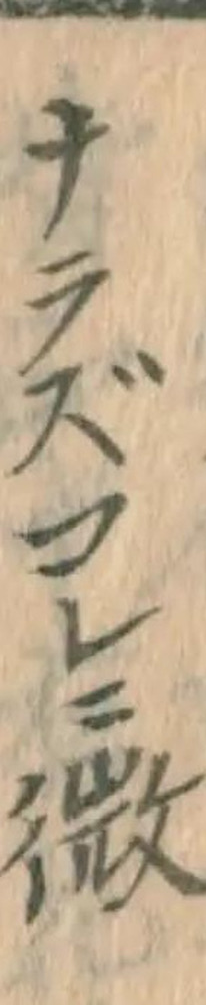ナラズコレニ微
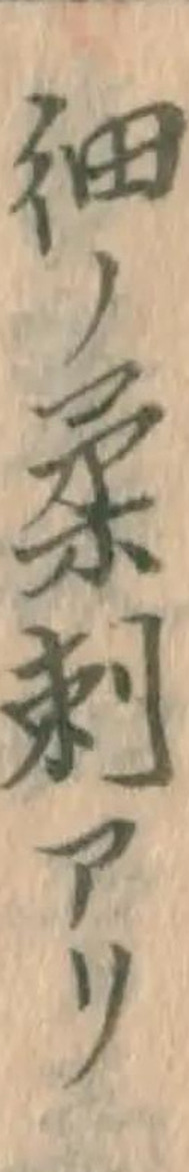細ノ柔刺アリ
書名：千蟲譜 3巻. [1]
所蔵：国立国会図書館 National Diet Library, JAPAN
